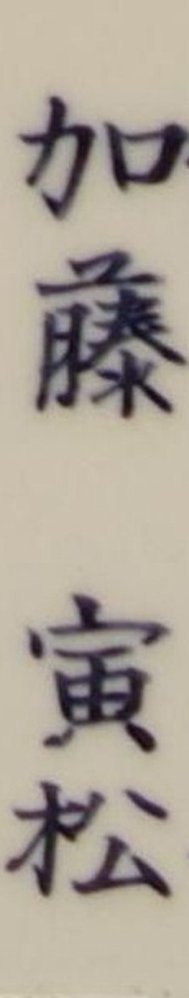加藤寅松
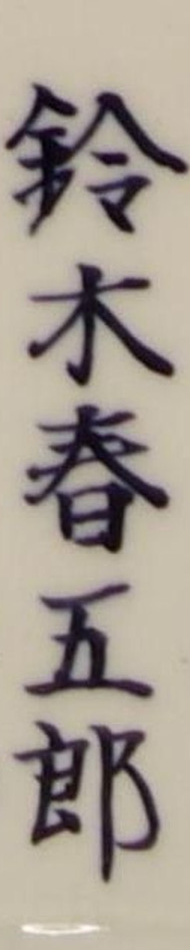鈴木春五郎
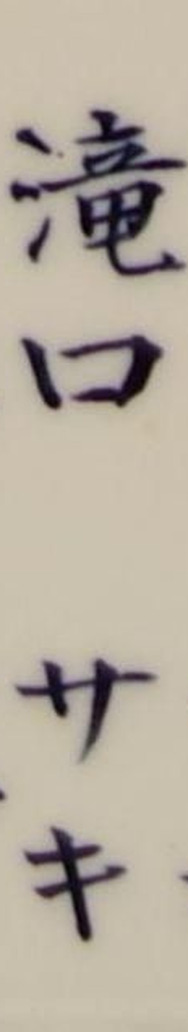滝口サキ
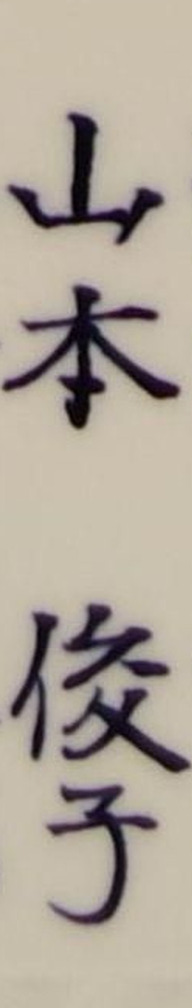山本俊子
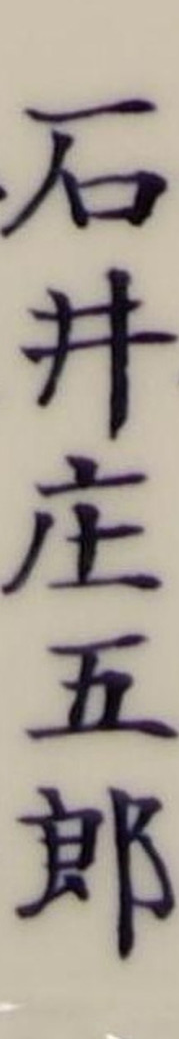石井庄五郎
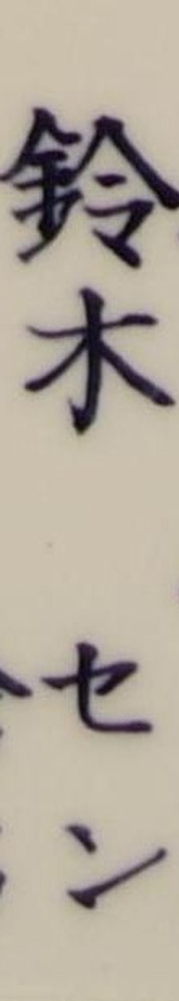鈴木セン
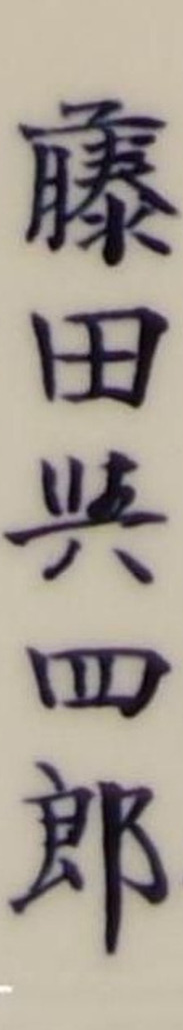藤田與四郎
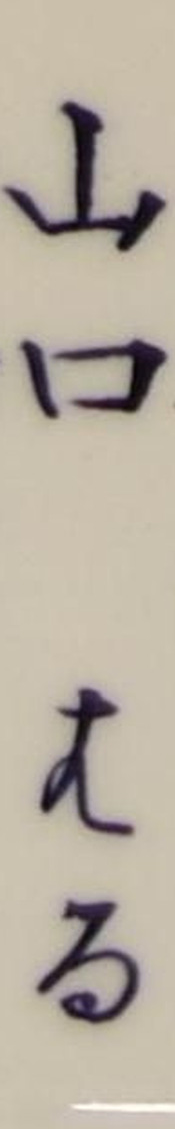山口はる
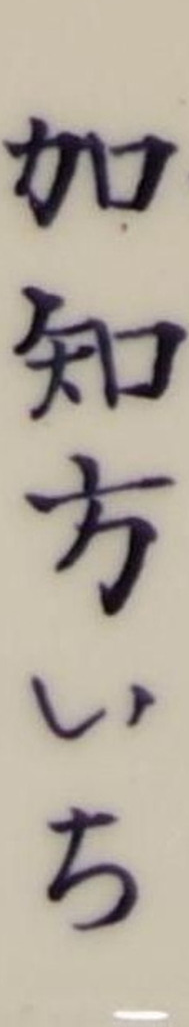加知方いち
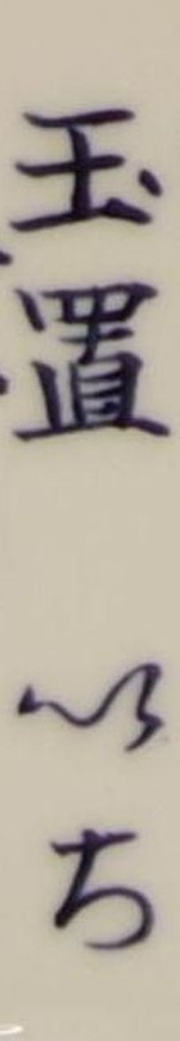玉置いち
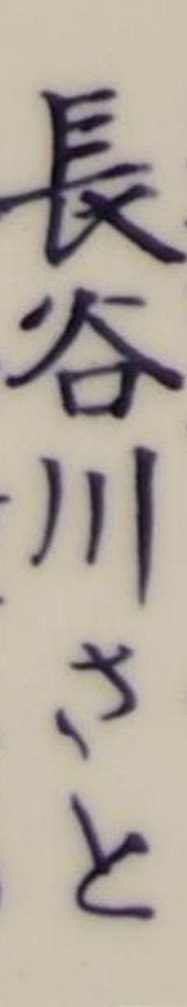長谷川さと
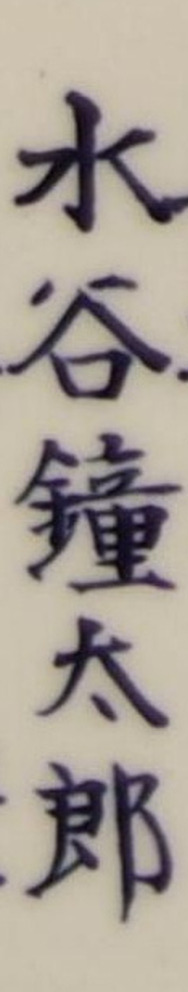水谷鐘太郎

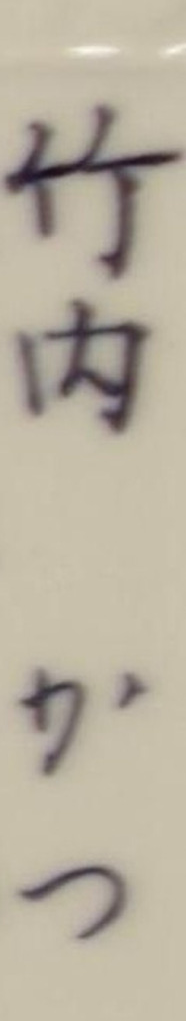竹内かつ
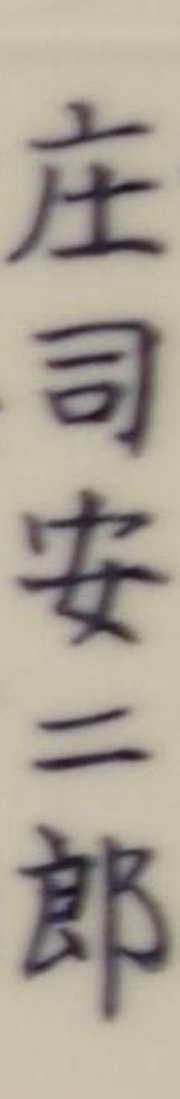庄司安二郎
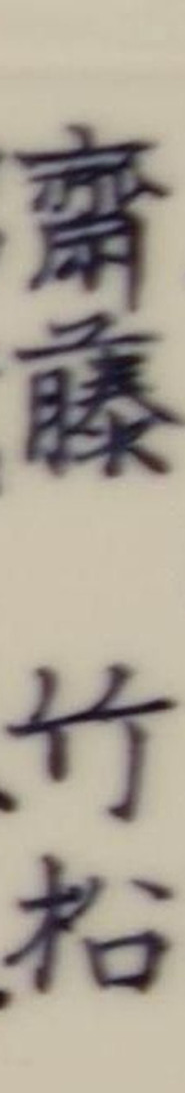斎藤竹松
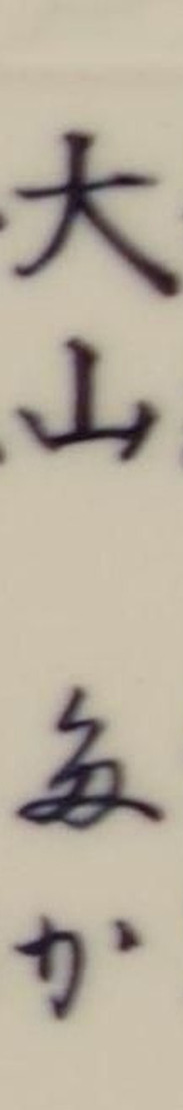大山たか
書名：E~L
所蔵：高野山金剛峯寺
